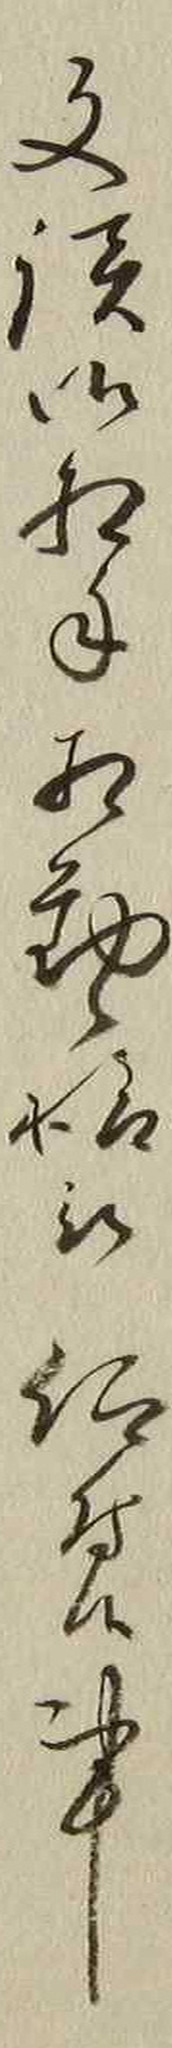文談御相手相勤候様被仰付候事
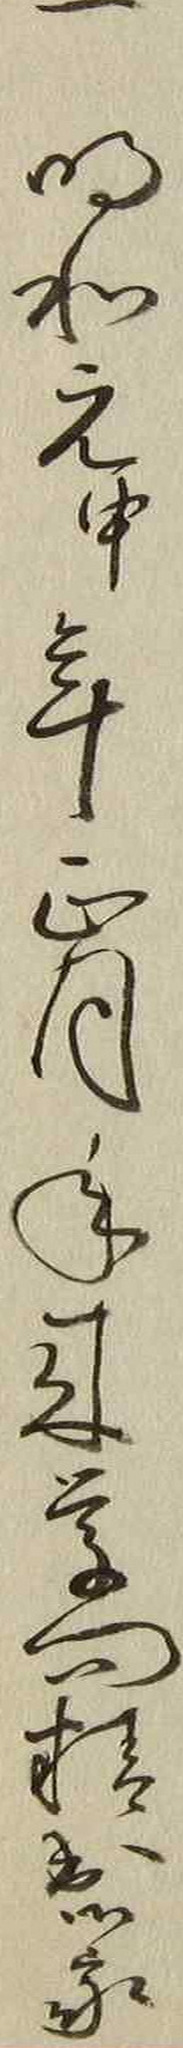一明和元申年正月年来学問精出御家
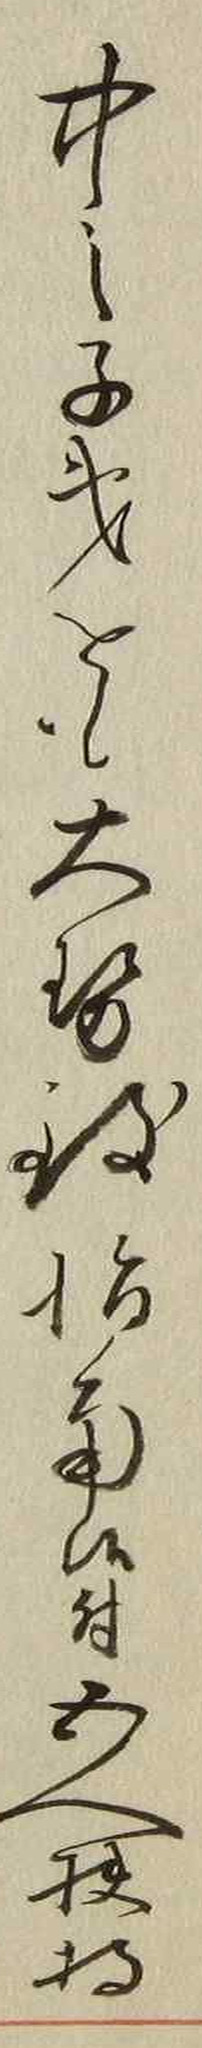中之子弟とも大勢致指南候付御五人扶持
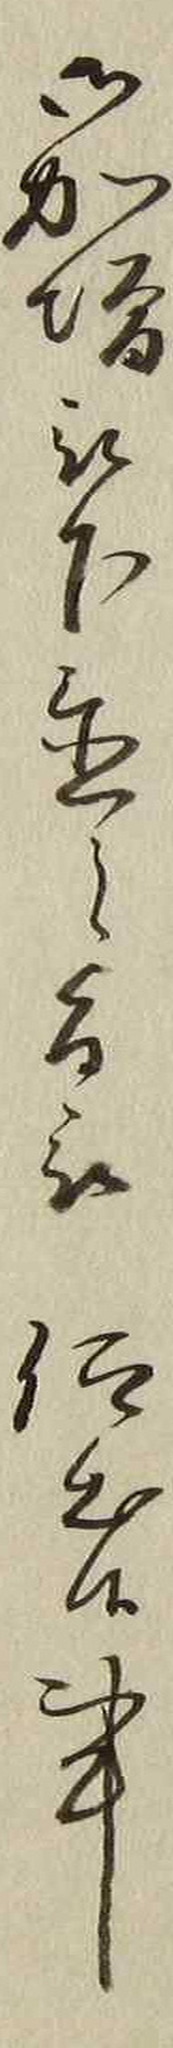御加増被下置之旨被仰出候事
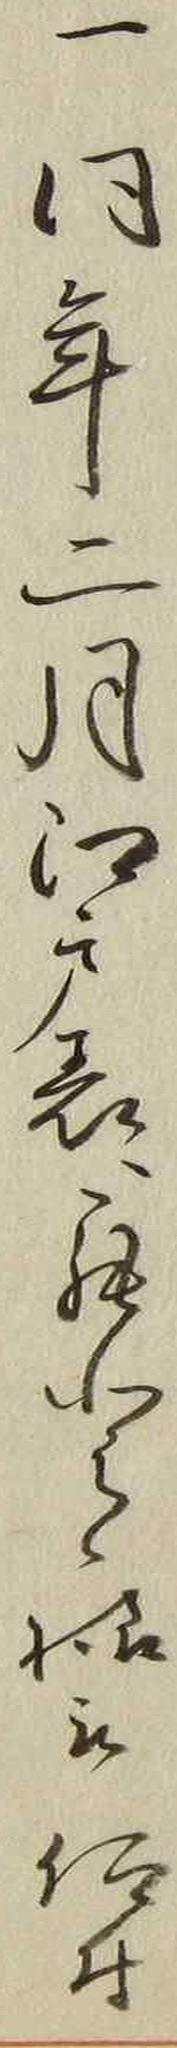一同年二月江戸表へ罷登候様被仰付
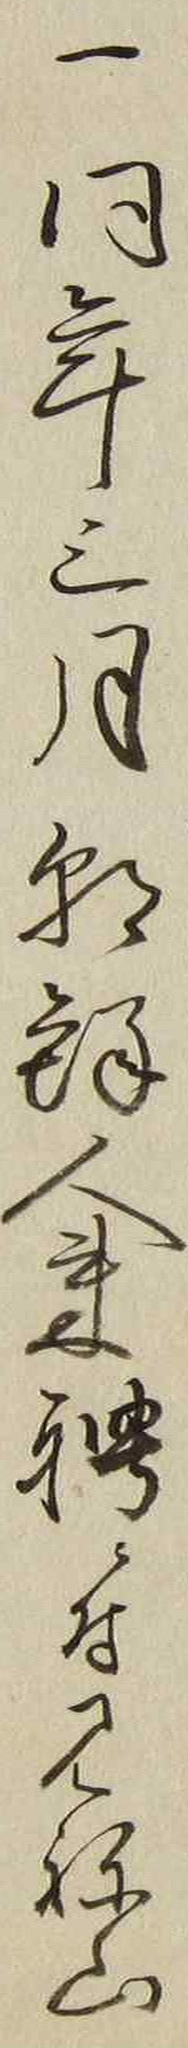一同年三月朝鮮人来聘に付見祢山
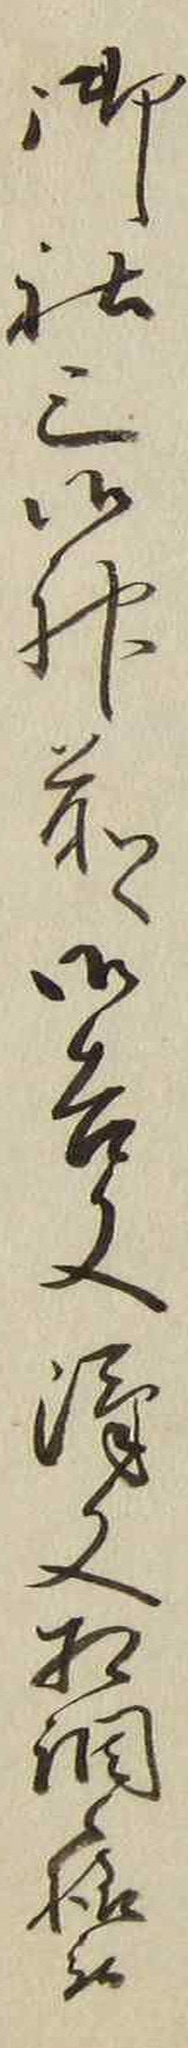御社上御神前へ御告文漢文相調候様被

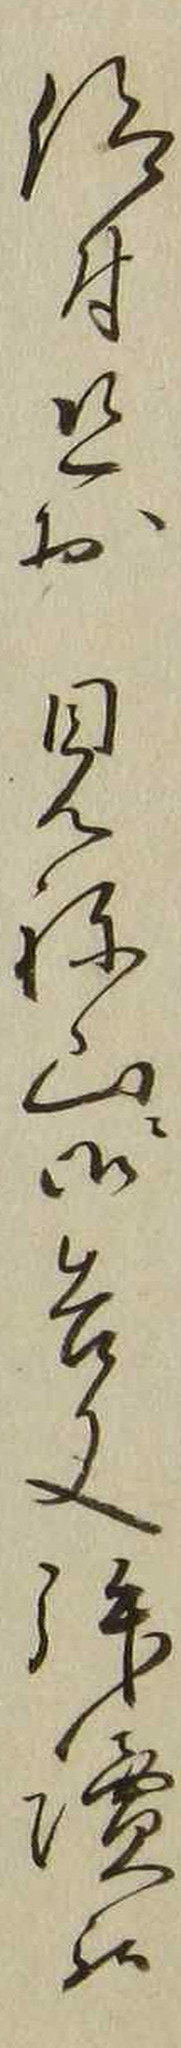仰付且於見祢山に御告文拝読被
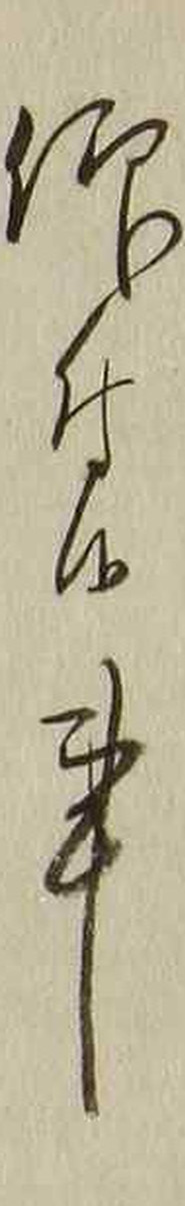仰付候事
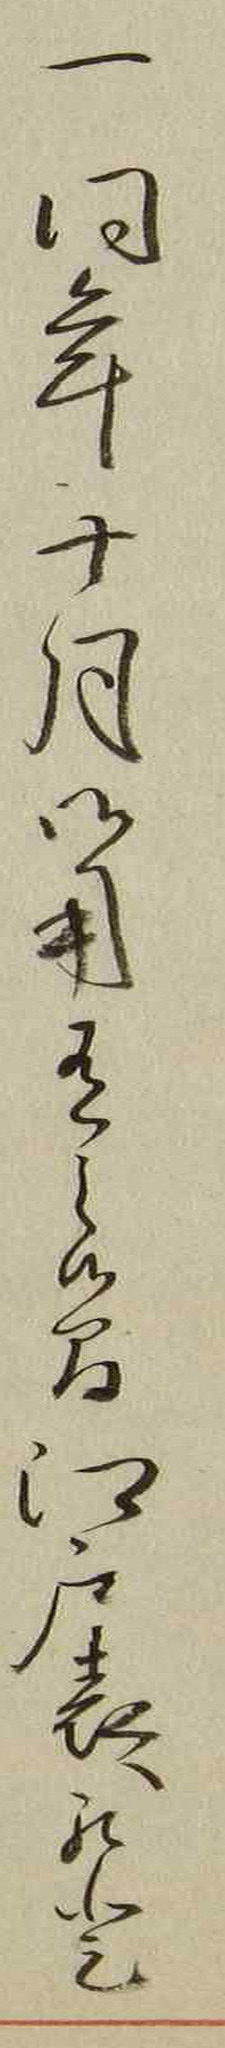一同年十月御用有之候間江戸表へ罷登
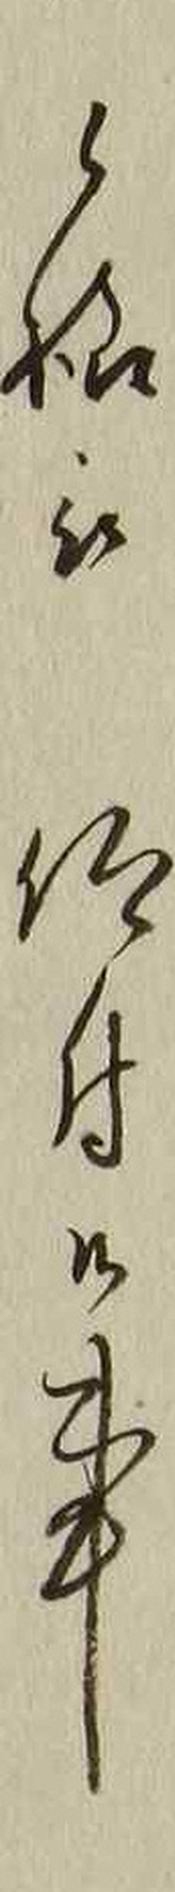候様被仰付候事
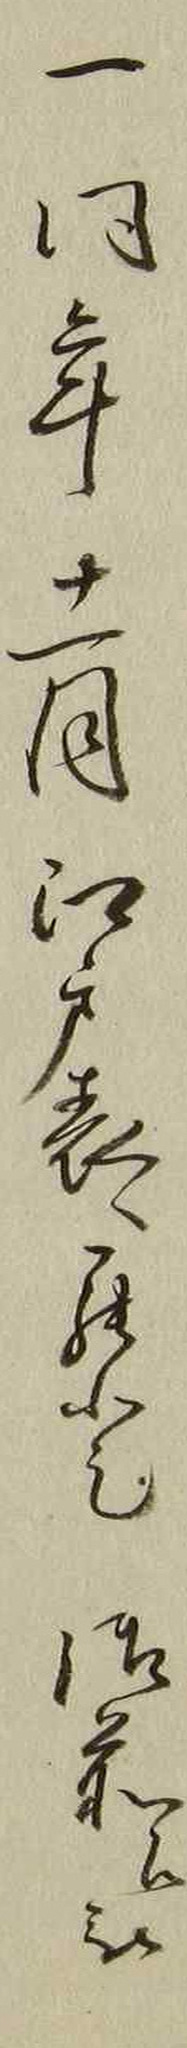一同年十一月江戸表へ罷登御前江被
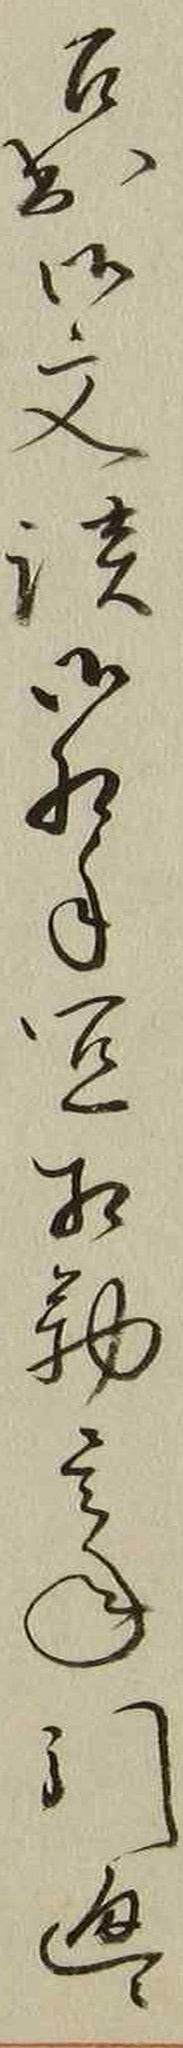召出御文談御相手宜相勤其年引通に
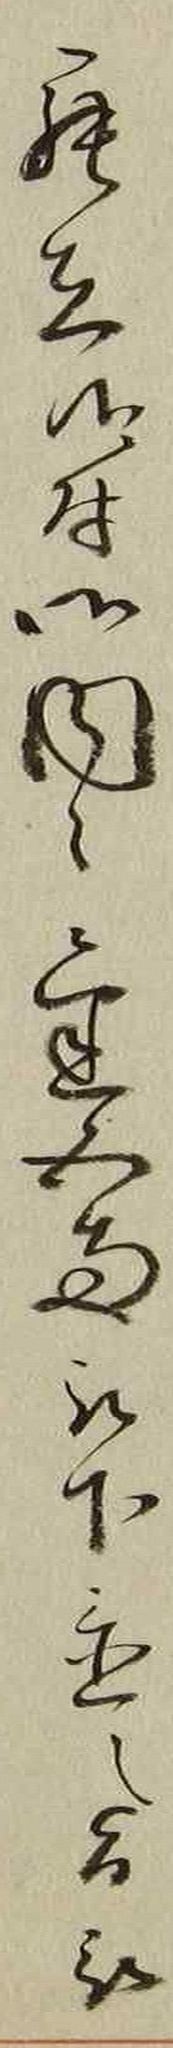罷在候に付御内々金五両被下置候旨被
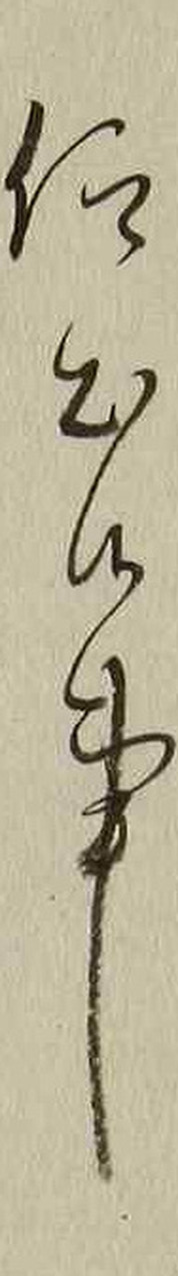仰出候事
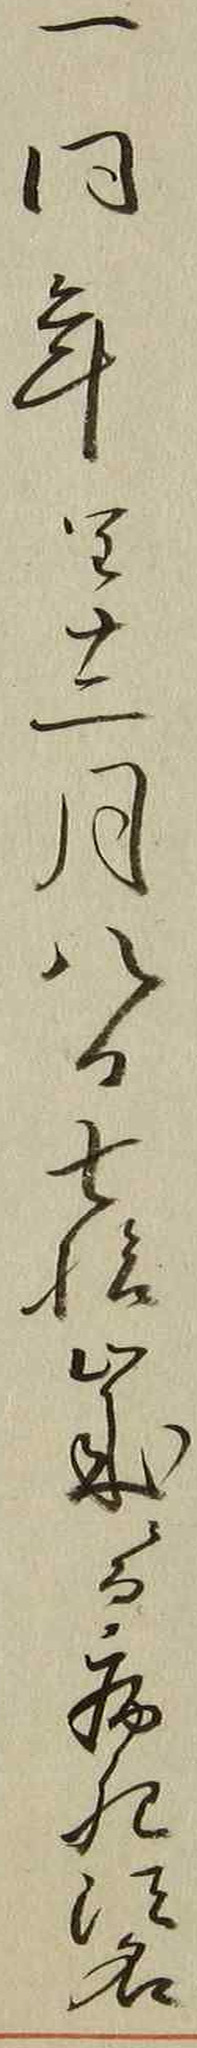一同年閏十二月八日七拾歳に而病死法名
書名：諸士系譜　巻之3　い之部3
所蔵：会津若松市立会津図書館
